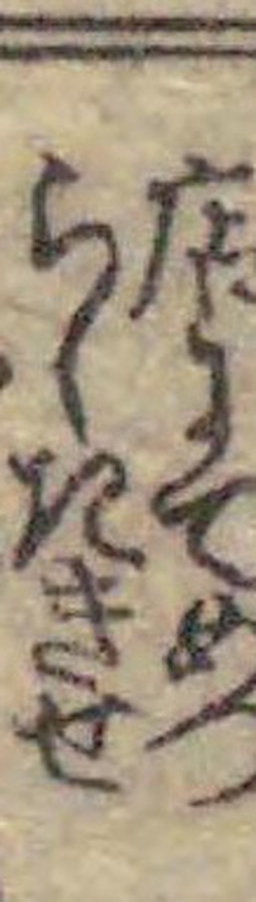らしききせ
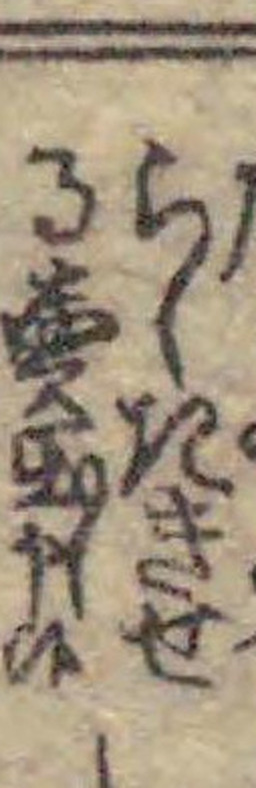る売出し申候
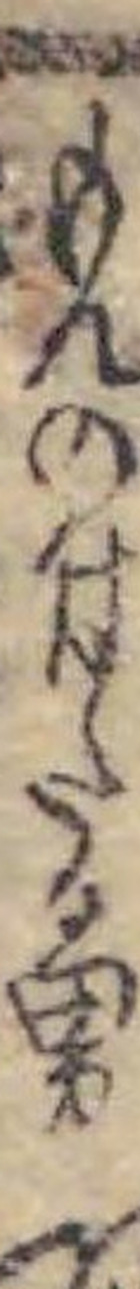もんの付たる男
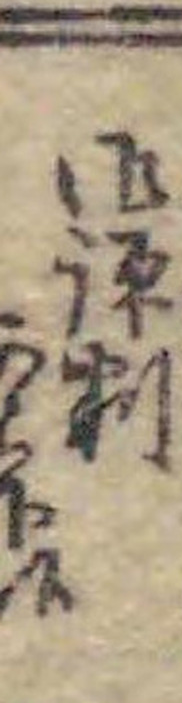御評判
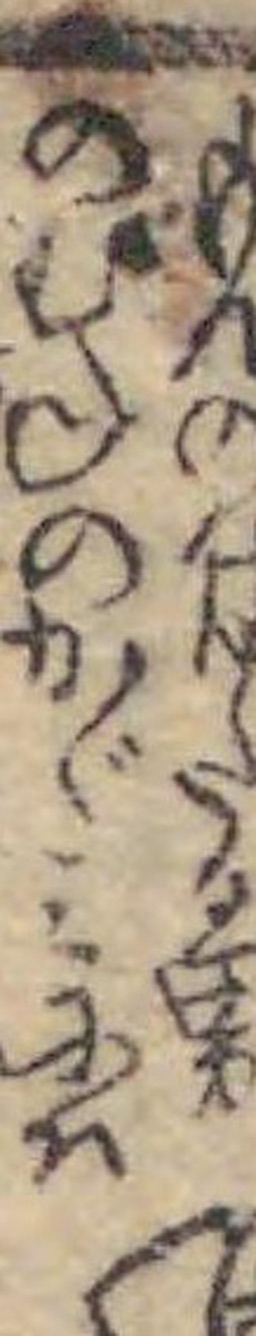のむねのかゞみには
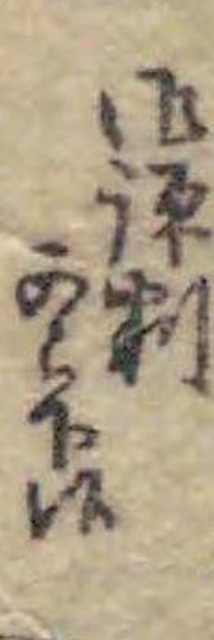可被下候
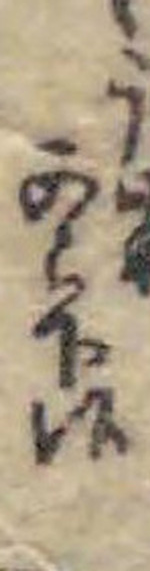可被下候
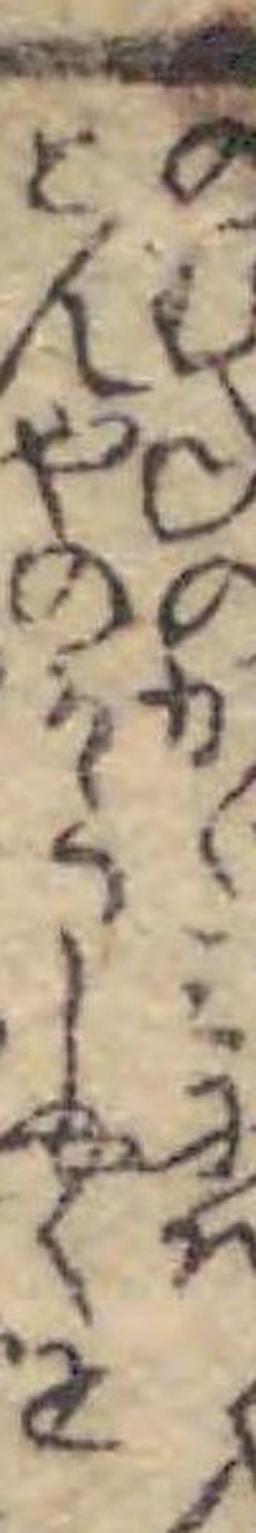こんやのかうしやくを
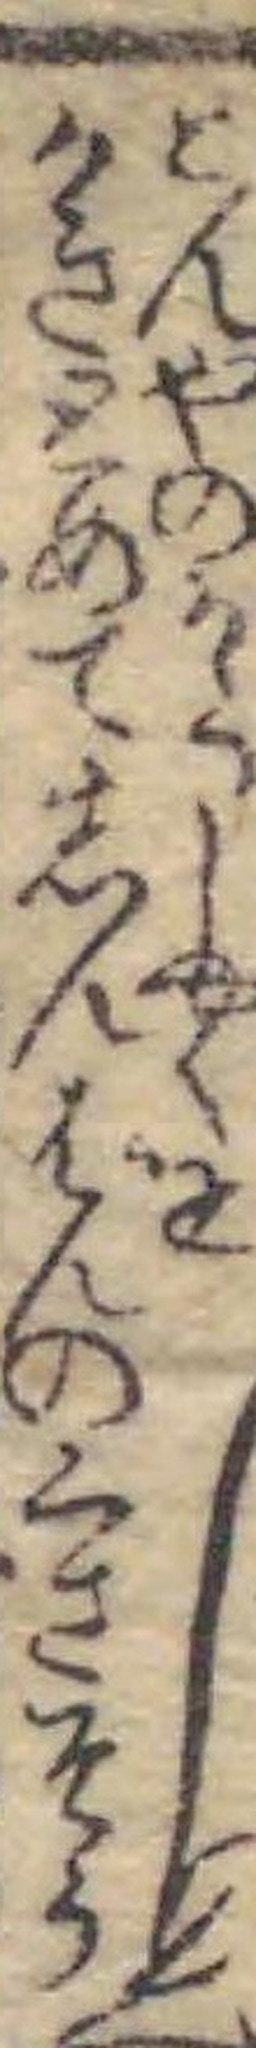かきとめてしんはんのくさそう
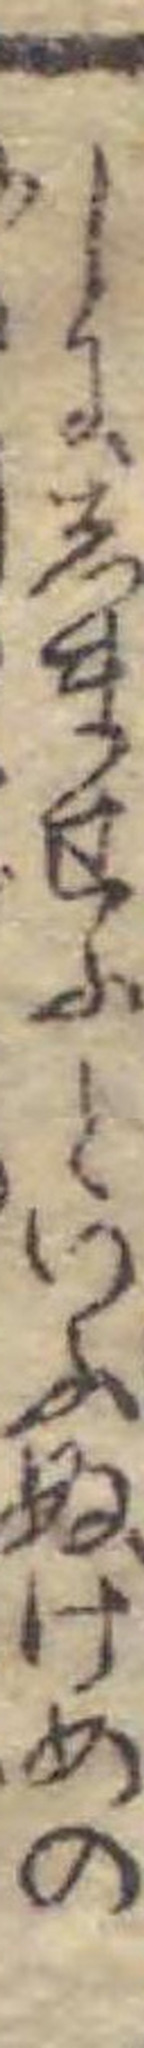しにしませふといふぬけめの
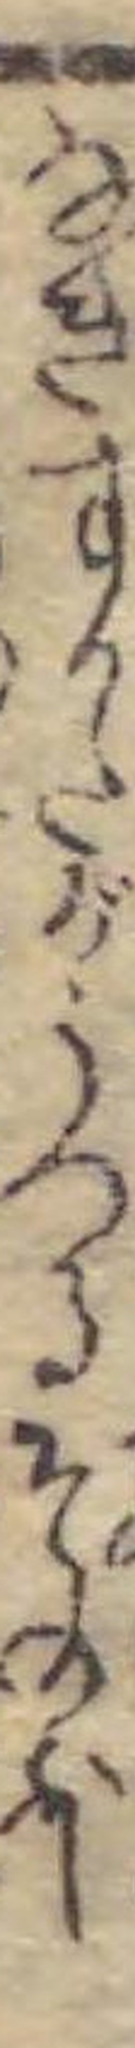なきすかたがうつるその外
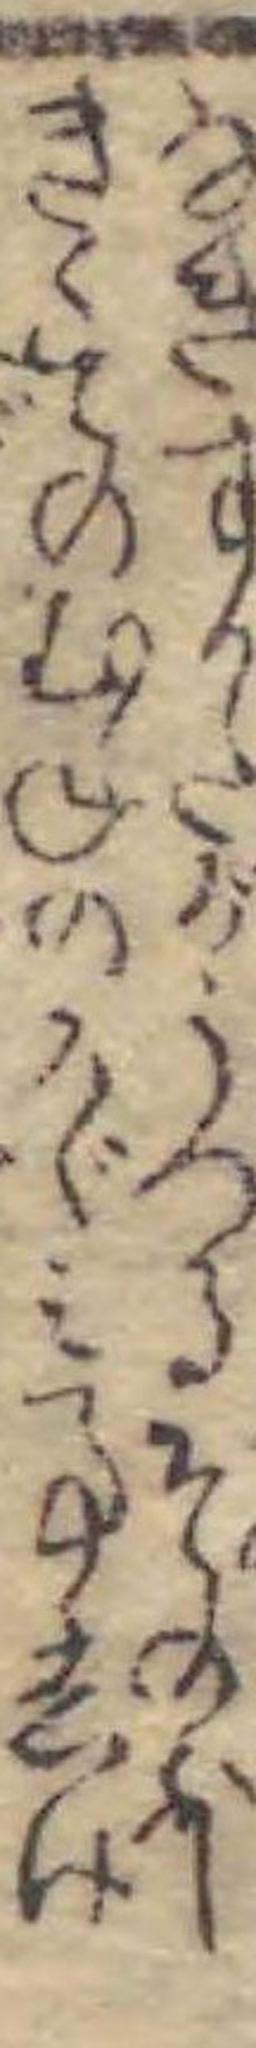きゝてのむねのかゞみ事しけ
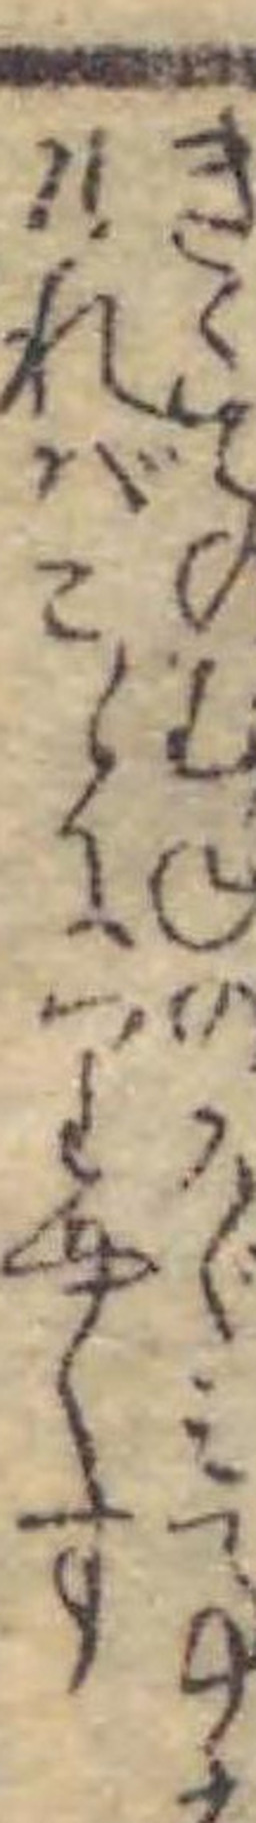ければこゝにりやくす
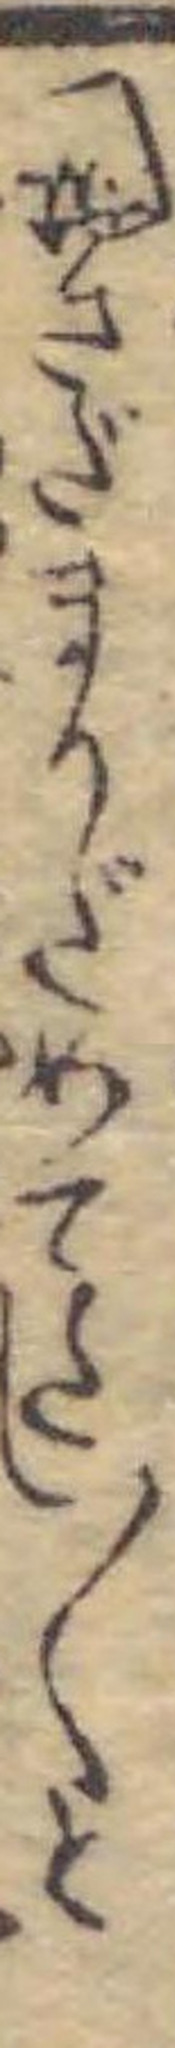〽おさだまりだめてたし〴〵と
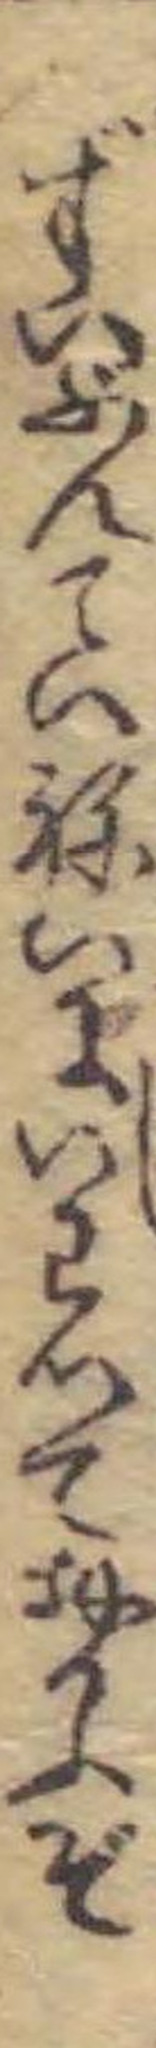ずいぶんていねいにいわつておかふぞ
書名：人心鏡写絵 : 3巻
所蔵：国立国会図書館 National Diet Library, JAPAN
